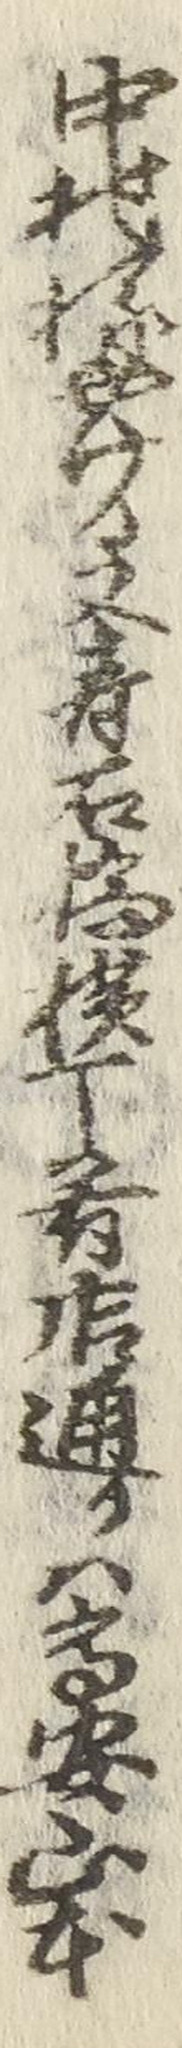中村様やける又青石橋横丁肴店通りは高安山本
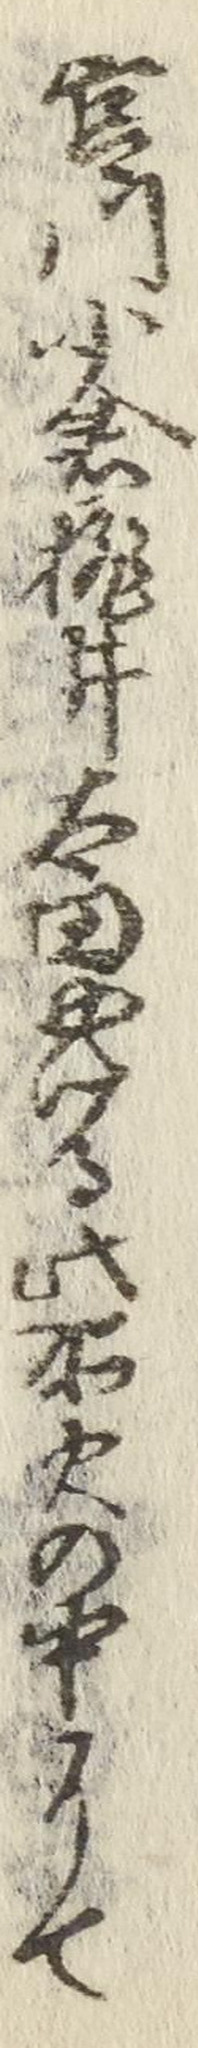宮川小倉桃井太田やける此所火の中にて
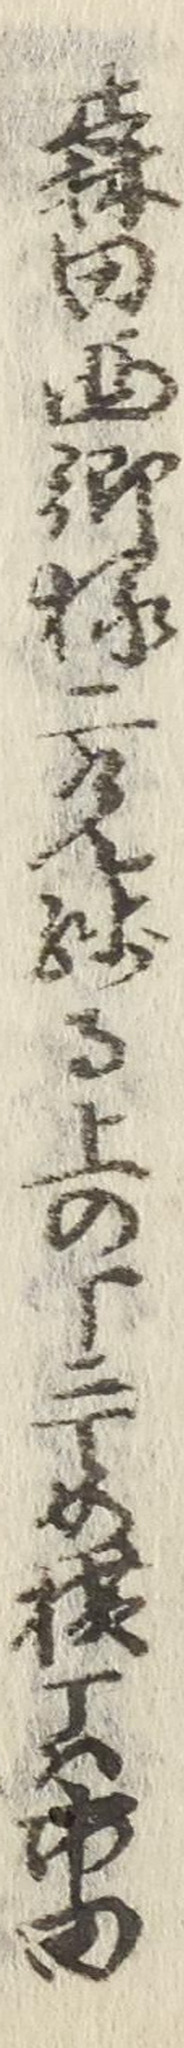森田西郷様二けん残る上の丁二丁目め横丁は市田
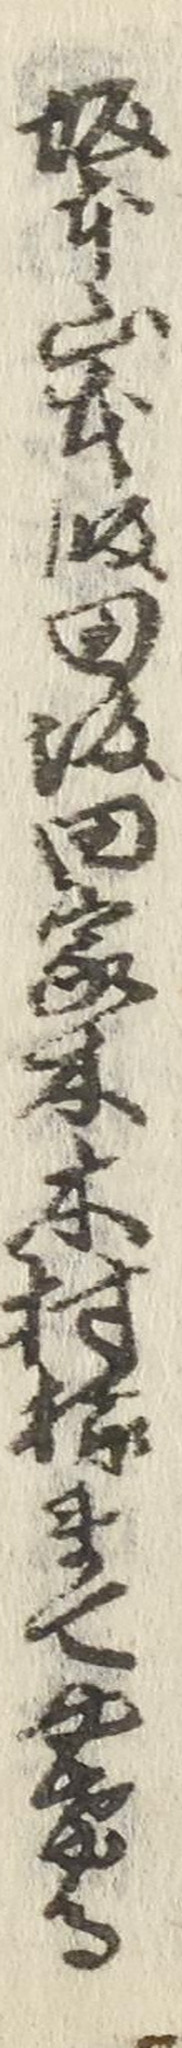坂本山本飯田坂田家木木村様までやける
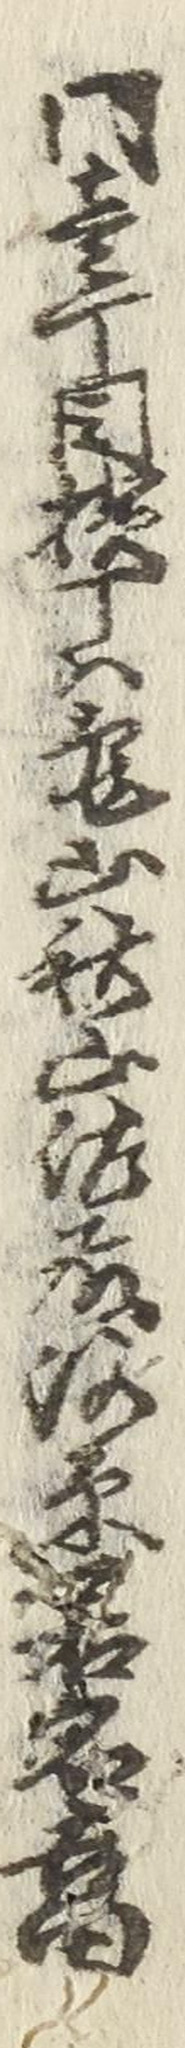同壱丁目横丁は亀山秋山佐藤河原若名吉田
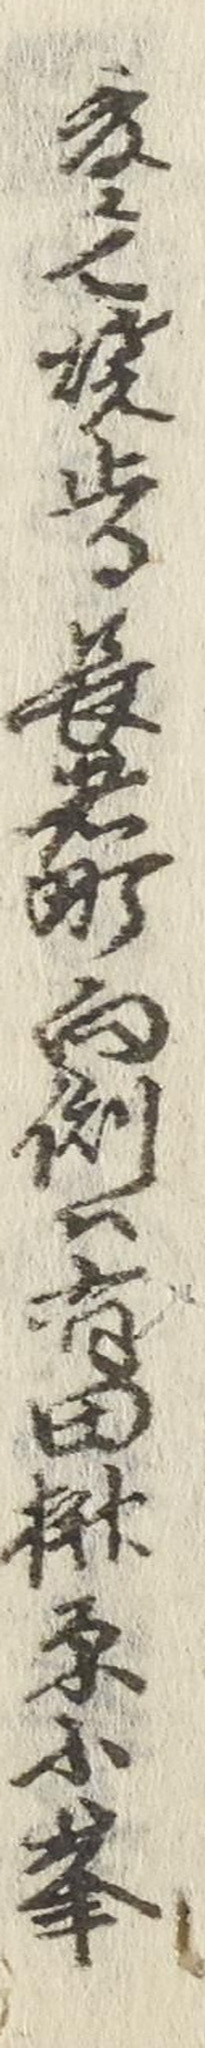爰にて焼止る長者丁向側は有田榊原小岸
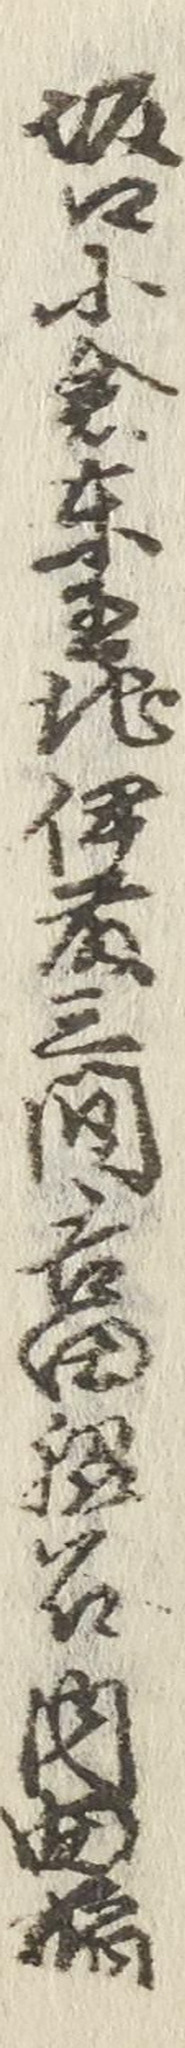坂口小倉東野地伊藤三間吉田脇谷内田橋
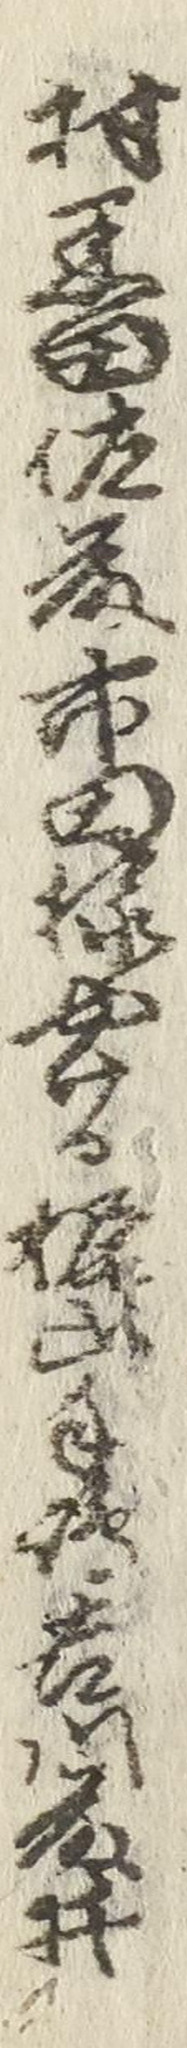村黒田佐藤市田様やける梶山手嶋吉川藤井
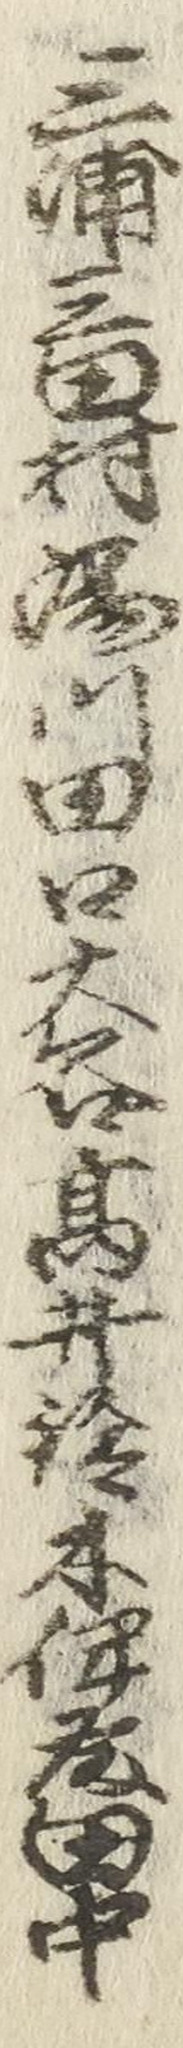三浦三田村湯川田口大谷高井鈴木伊藤田中
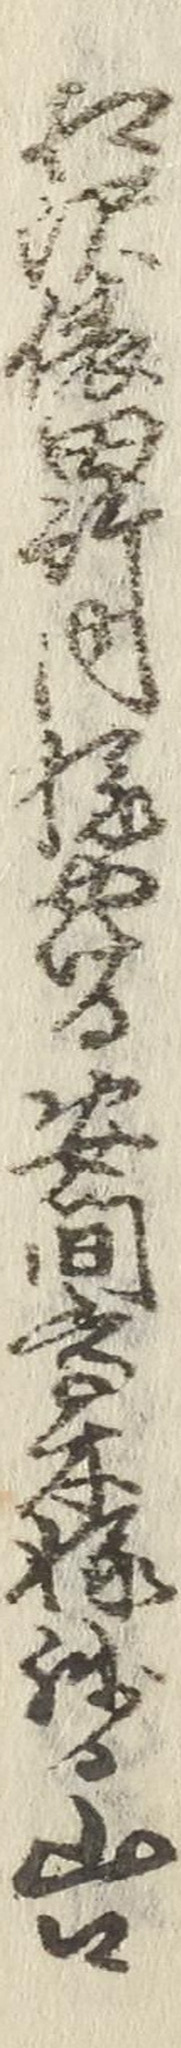相沢俵田竹内様やける安間高木様残る山口
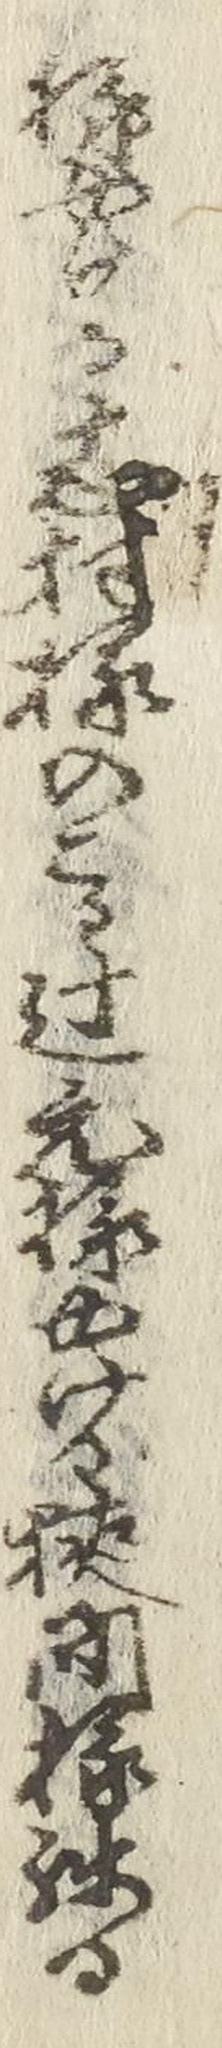様やける志村様のこる辻元様やける狭間残る
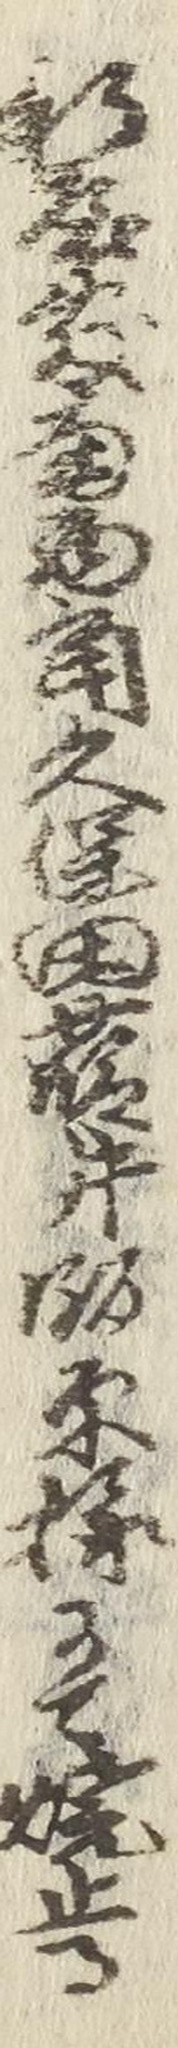新屋敷南西角久保田藤井飯原様にて焼止る
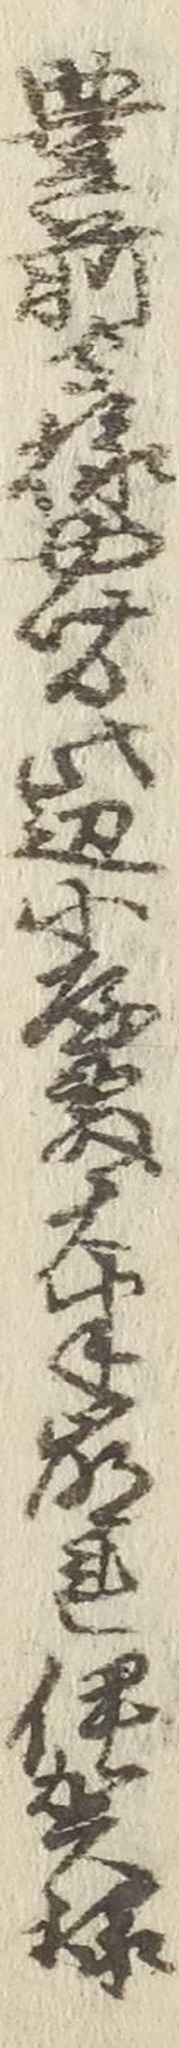豊前守様やける此辺小屋敷大半崩れ伊賀様
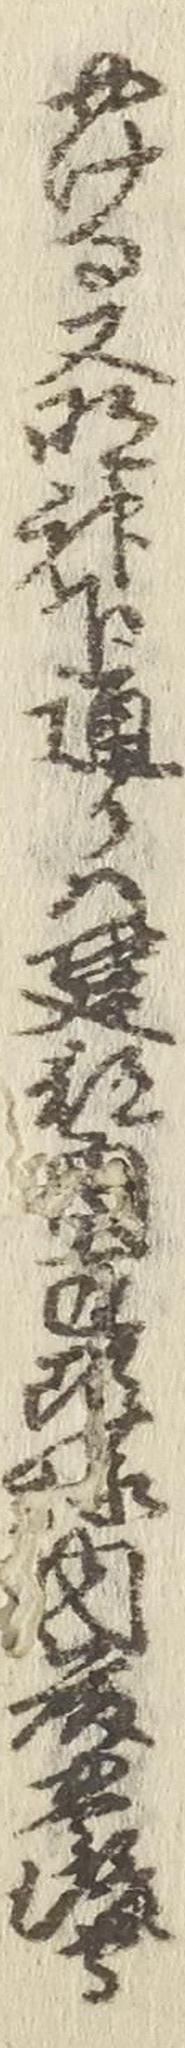やける又明神下通りは建部内匠頭様内藤豊後守
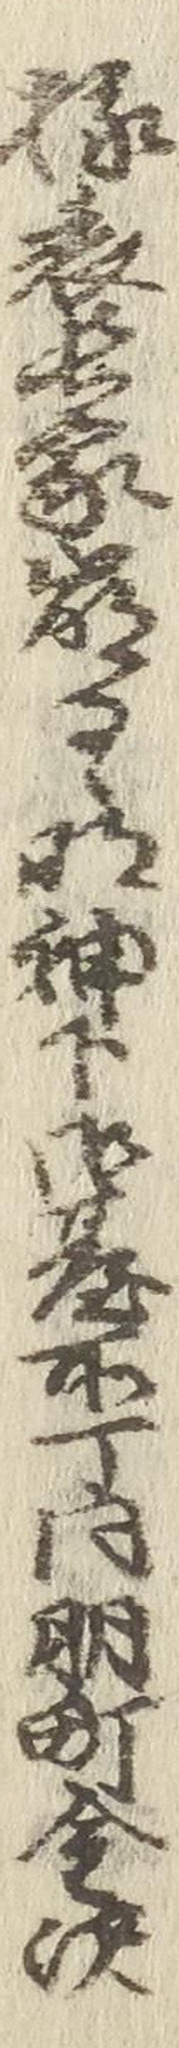様表長家崩るゝ明神下御台所丁同朋丁金沢
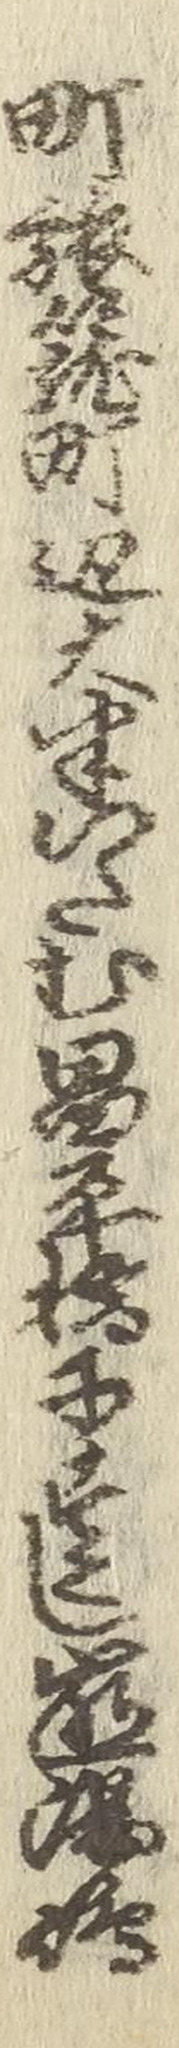町旅篭町辺大半いたむ昌平橋少そんじ崩湯嶋
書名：地震出火　男女死人怪我人書上之寫
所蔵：東京大学地震研究所図書室 Earthquake Research Institute Library, The University of Tokyo, JAPAN
